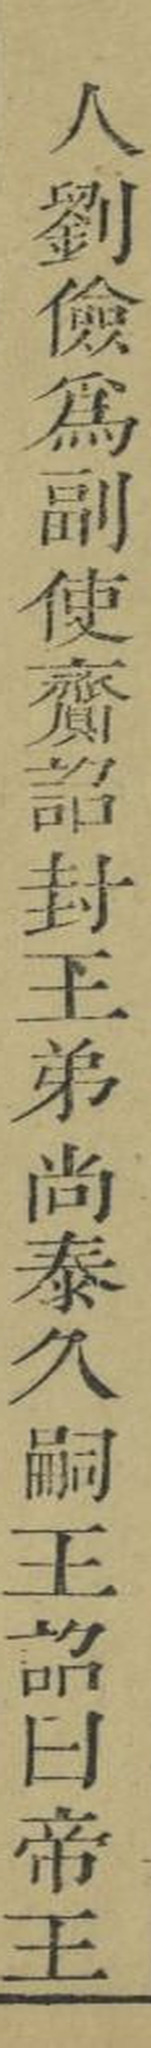人劉倹為副使齎詔封王弟尚泰久嗣王詔曰帝王
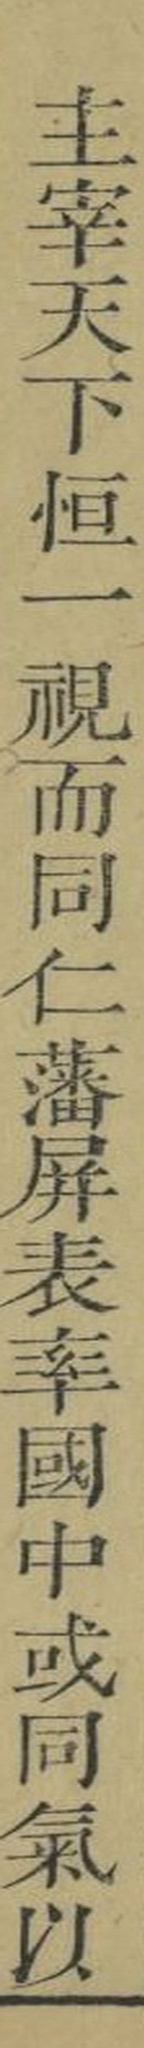主宰天下恒一視而同仁藩屏表率国中或同気以
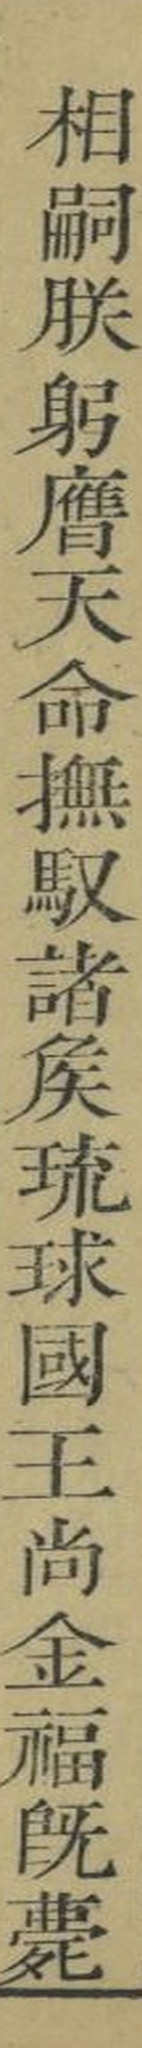相嗣朕躬膺天命撫馭諸侯琉球国王尚金福既薨
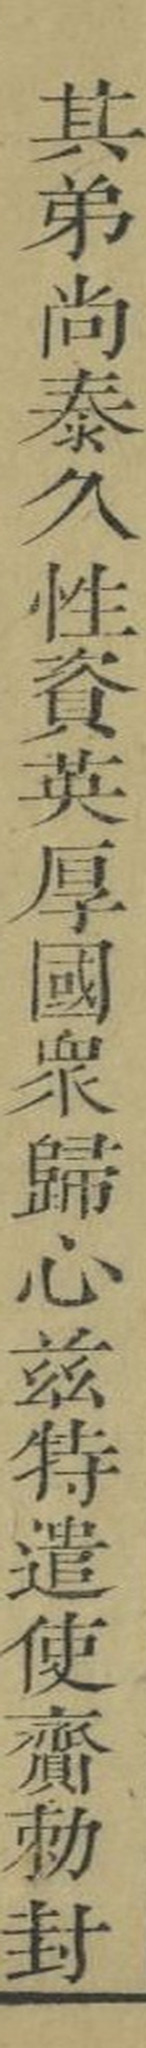其弟尚泰久性資英厚国衆帰心茲特遣使齎勅封
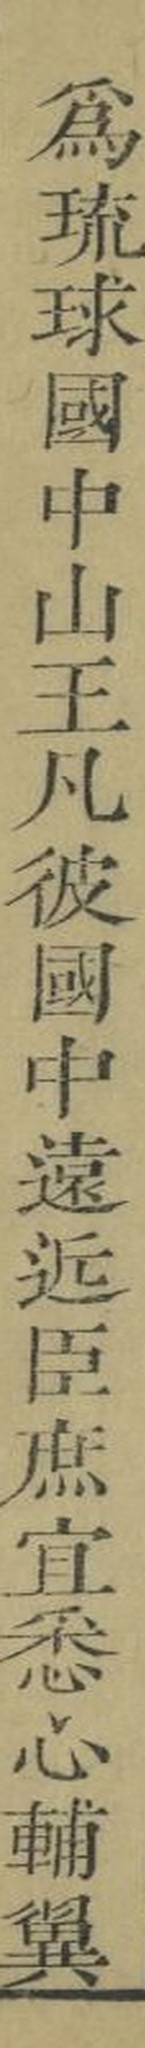為琉球国中山王凡彼国中遠近臣庶宜悉心輔翼
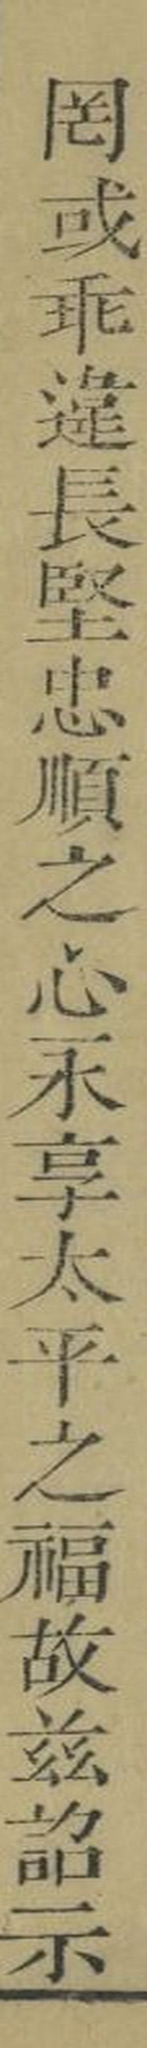罔或乖違長堅忠順之心永享太平之福故茲詔示
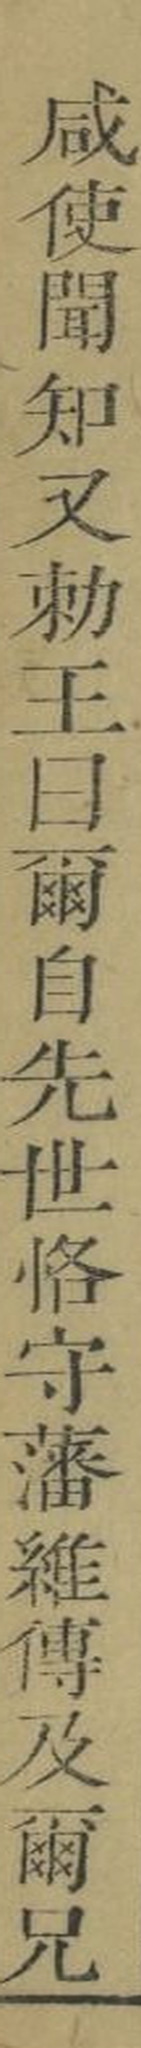咸使聞知又勅王曰爾自先世恪守藩維伝及爾兄

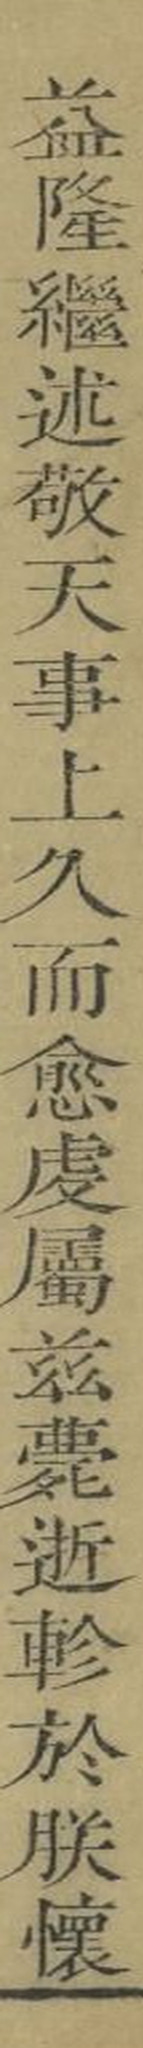益隆継述敬天事上久而愈虔属茲薨逝軫於朕懐
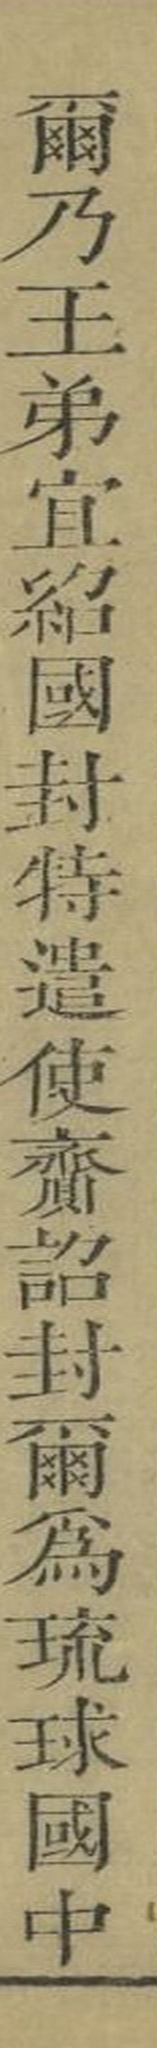爾乃王弟宜紹国封特遣使齎詔封爾為琉球国中
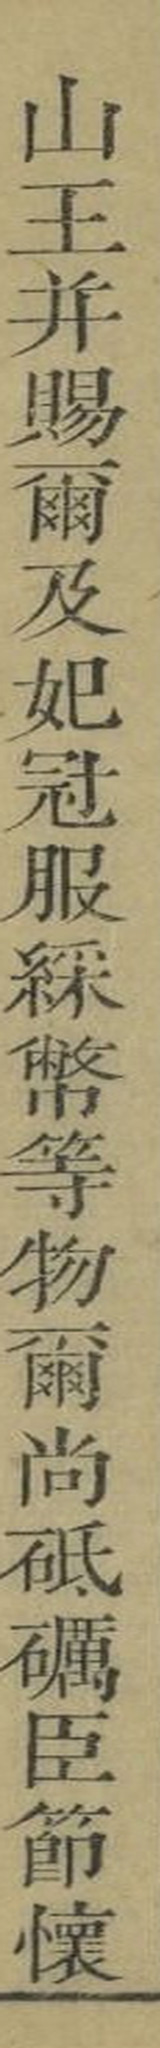山王并賜爾及妃冠服綵幣等物爾尚砥礪臣節懐
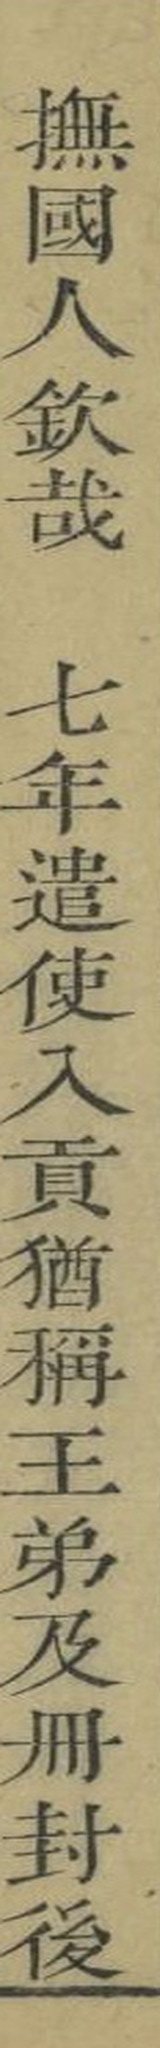撫国人欽哉七年遣使入貢猶称王弟及冊封後
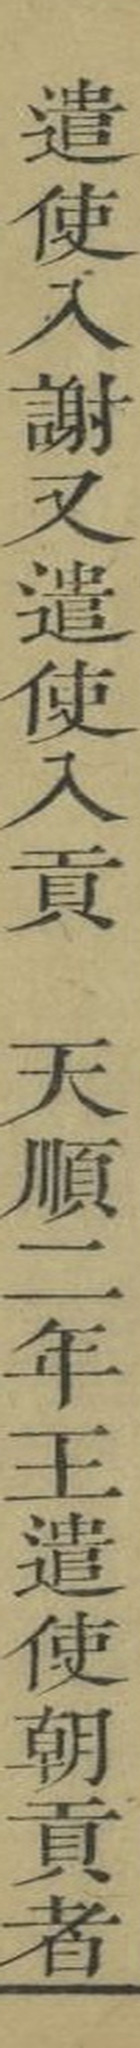遣使入謝又遣使入貢天順二年王遣使朝貢者
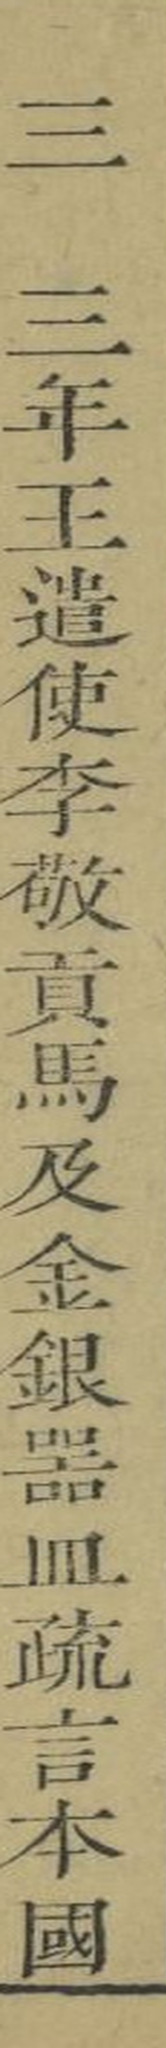三三年王遣使李敬貢馬及金銀器皿疏言本国
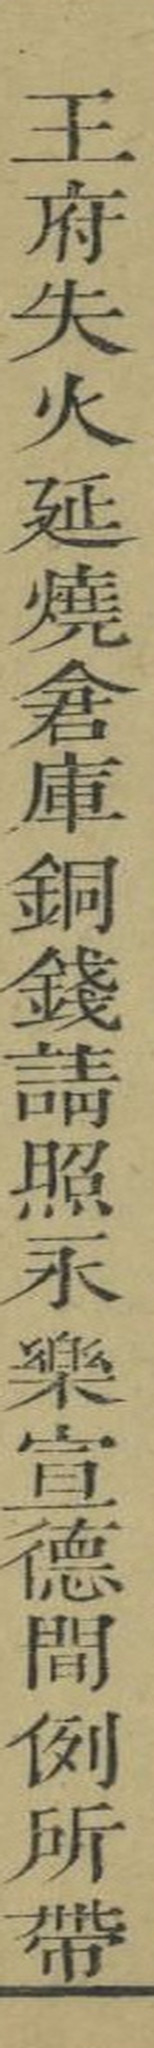王府失火延焼倉庫銅銭請照永楽宣徳間例所帯
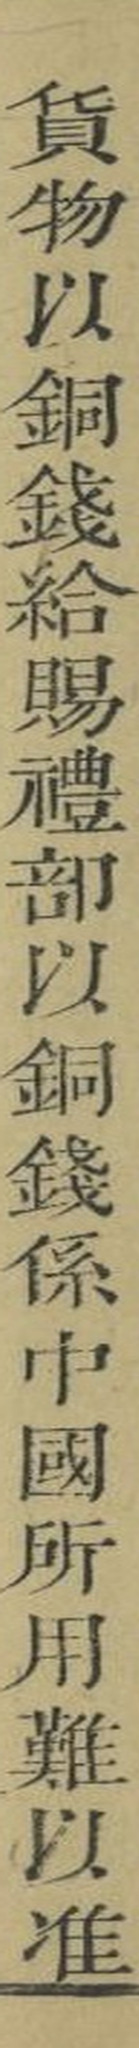貨物以銅銭給賜礼部以銅銭係中国所用難以准
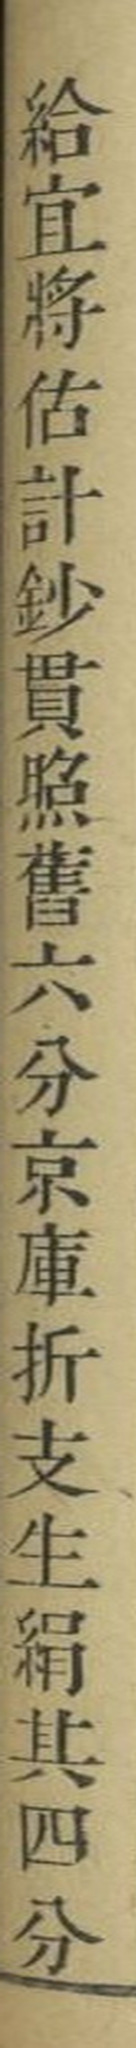給宜将估計鈔貫照旧六分京庫折支生絹其四分
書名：中山伝信録 巻三
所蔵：University of the Ryukyus Library
